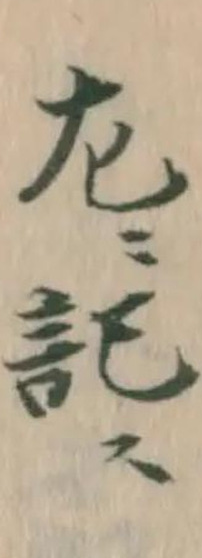左ニ記ス
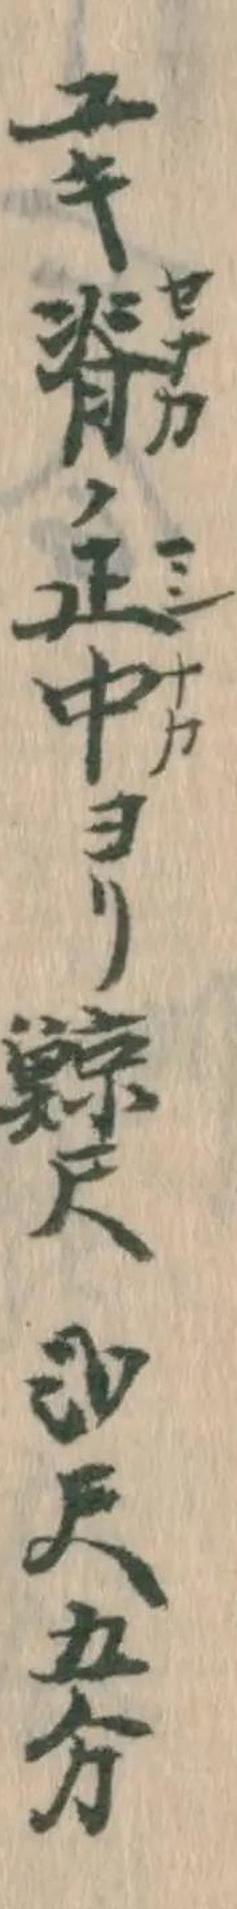ユキ脊ノ正中ヨリ鯨尺弐尺五分
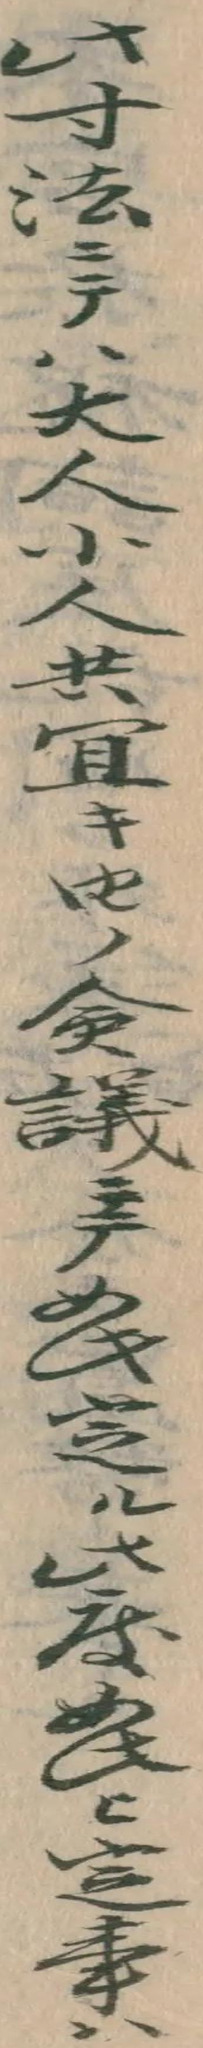此寸法ニテハ大人小人共宜キ由ノ僉議ニテ如此定ル此度如此被定事ハ
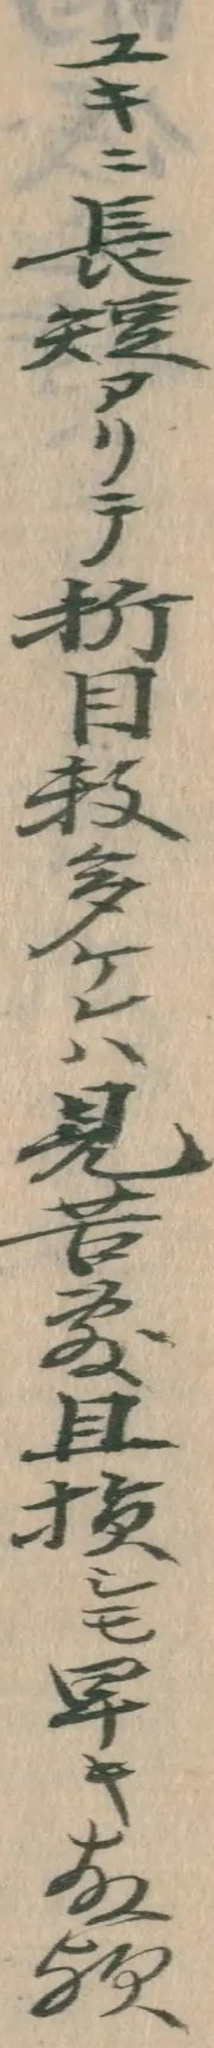ユキニ長短アリテ折目数多ケレハ見苦敷且損シモ早キ故歟
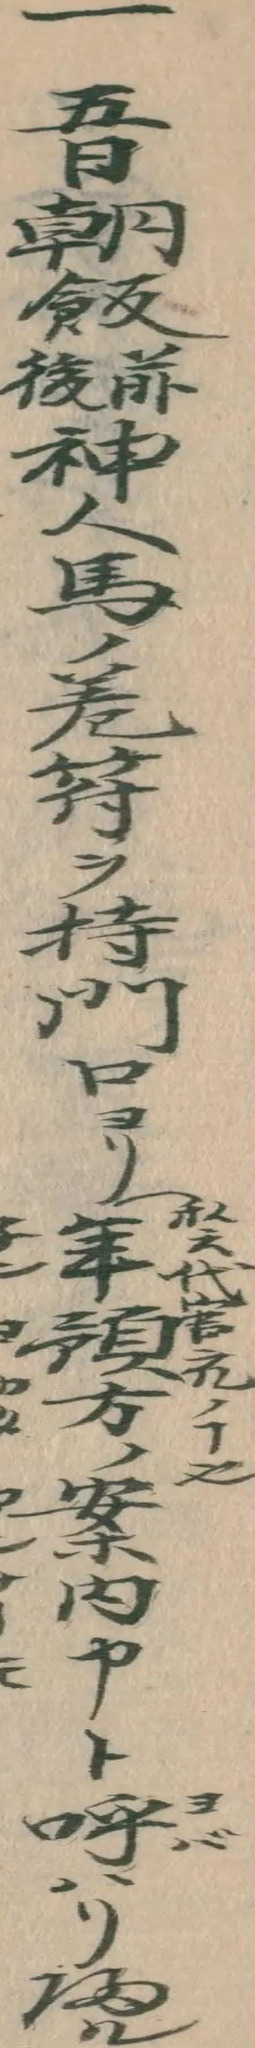一五日朝飯前後神人馬ノ差符ヲ持門ロヨリ\年預方ノ案内申ト呼ハリ帰ル
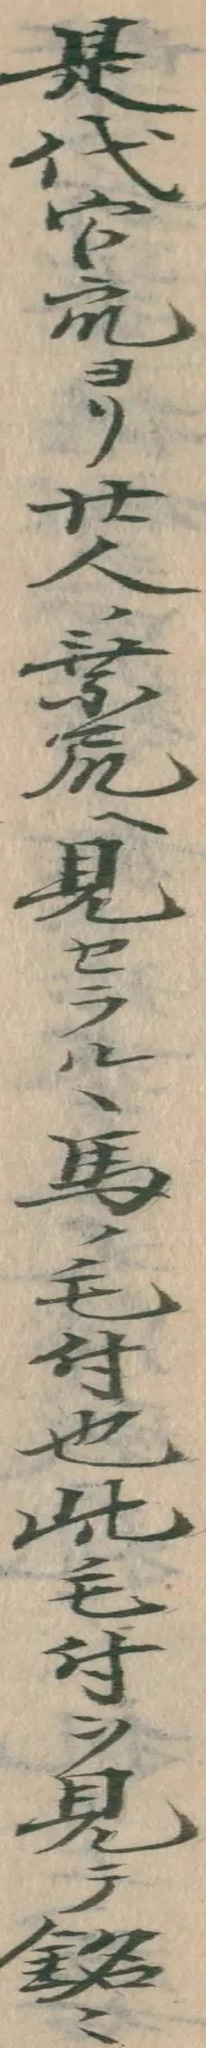是代官衆ヨリ廿人ノ乗尻ヘ見セラルヽ馬ノ毛付也此毛付ヲ見テ銘々
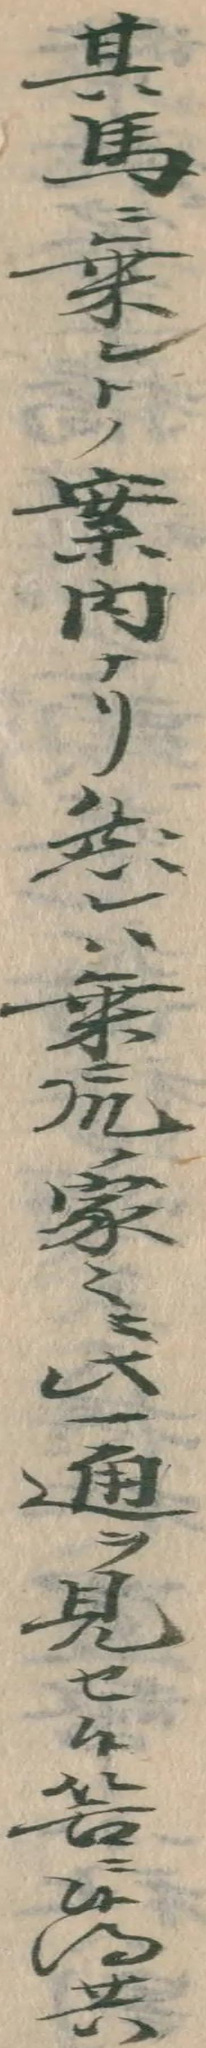其馬ニ乗レトノ案内ナリ然レハ乗尻ノ家々ニ此一通ヲ見セ候筈ニ候得共
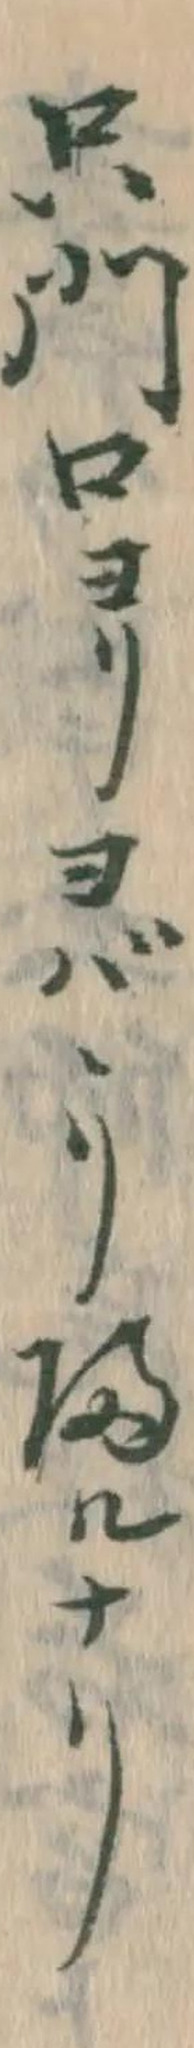只門口ヨリヨバヽリ帰ルナリ
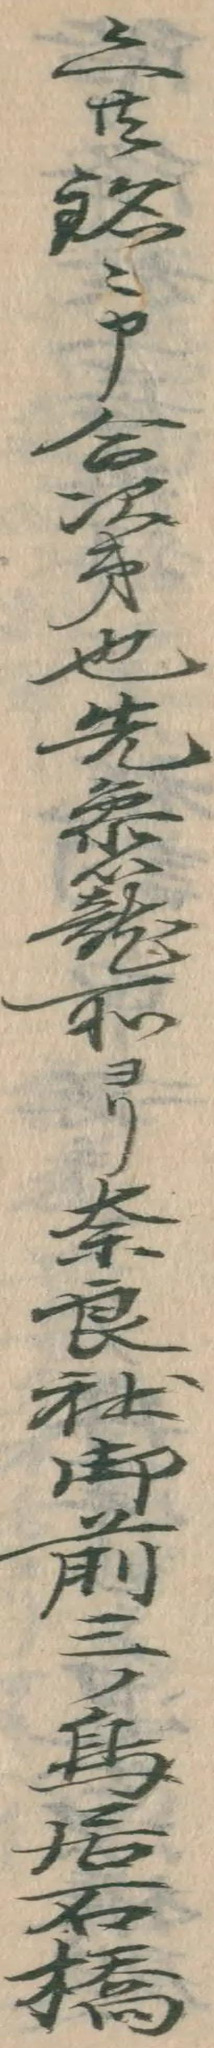候へ共銘々申合次第也先参籠所ヨリ奈良社御前三ノ鳥居石橋
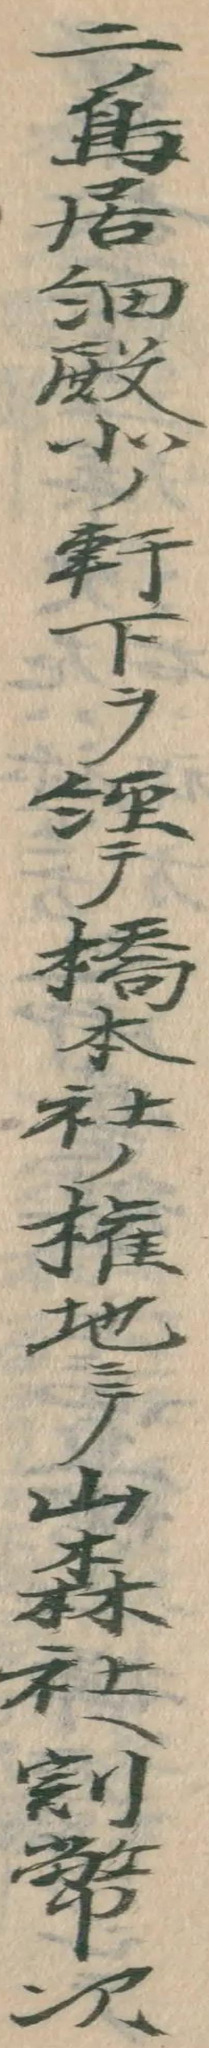二ノ鳥居細殿北ノ軒下ヲ経テ橋本社ノ権地ニテ山森社へ割幣次
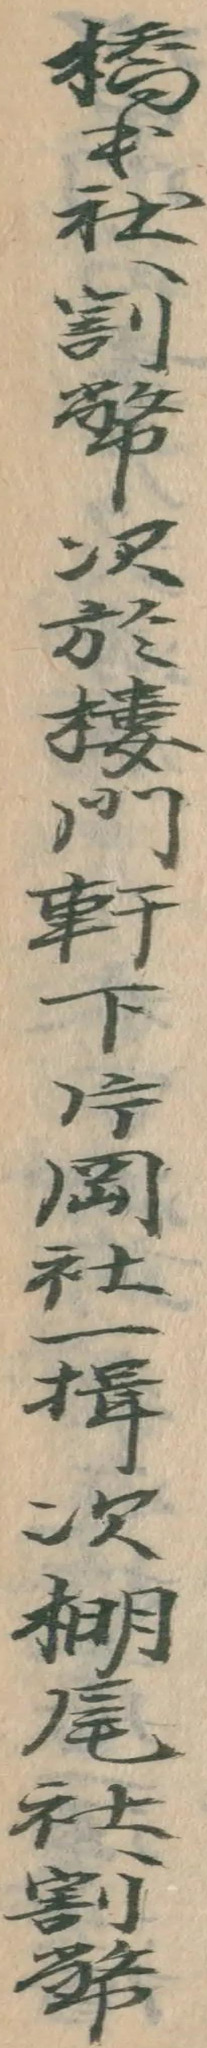橋本社へ割幣次於桜門軒下片岡社一揖次棚尾社ヘ割弊

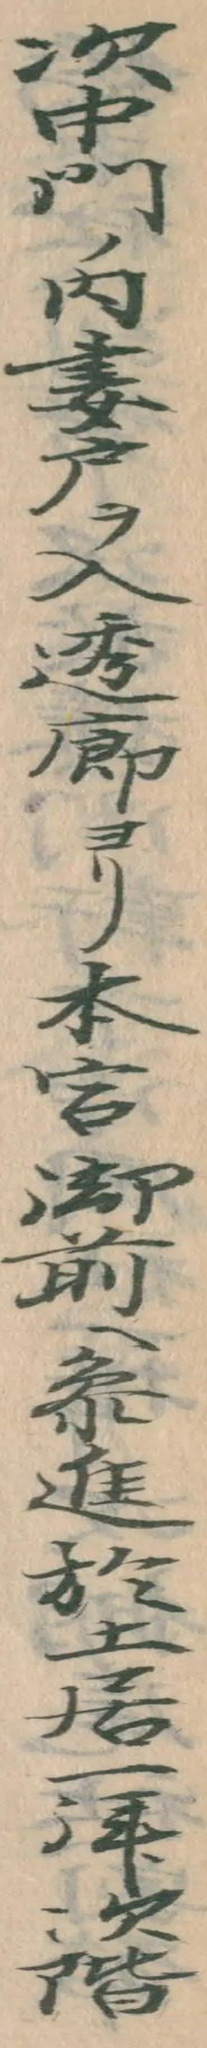次中門ノ内妻戸ヲ入透廊ヨリ本宮御前へ参進於土居一拝次階
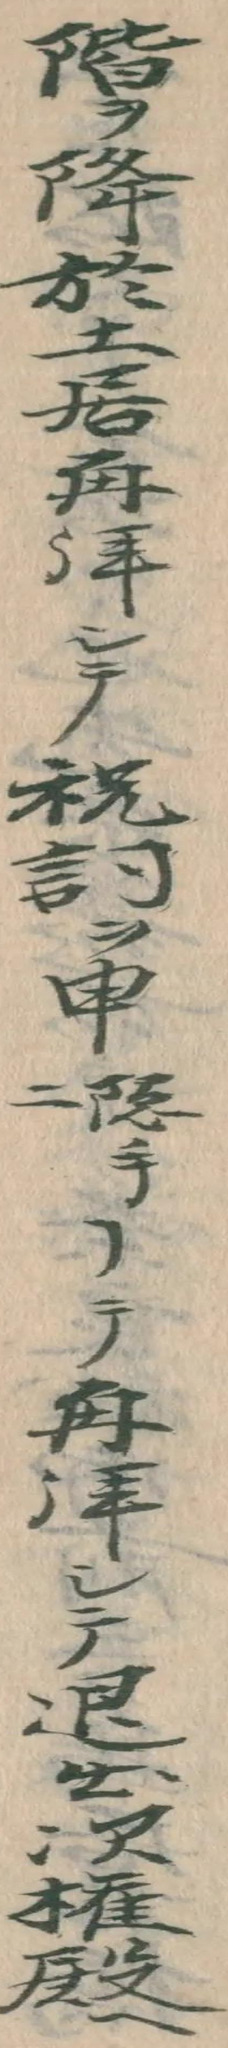階ヲ降於土居再拝シテ祝詞ヲ申隠手ニ了テ再拝シテ退出次権殿ヘ
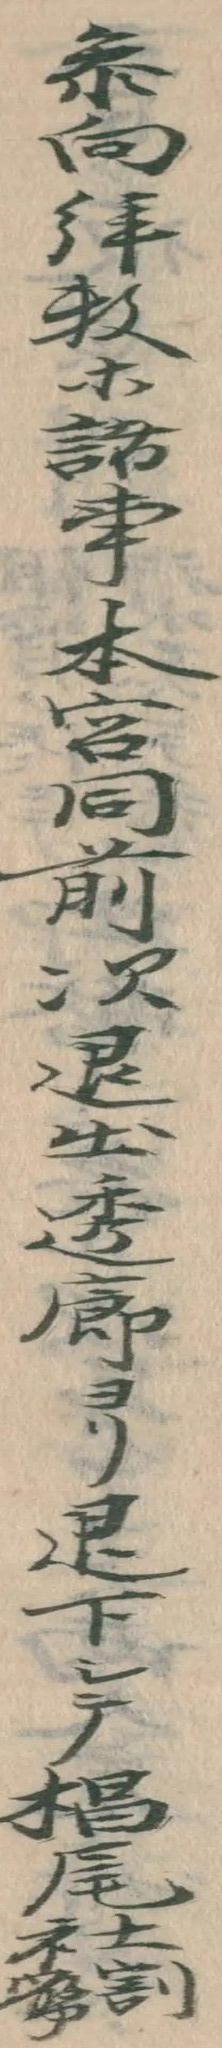参向拝数等諸事本宮同前次退出透廊ヨリ退下シテ椙尾社割弊
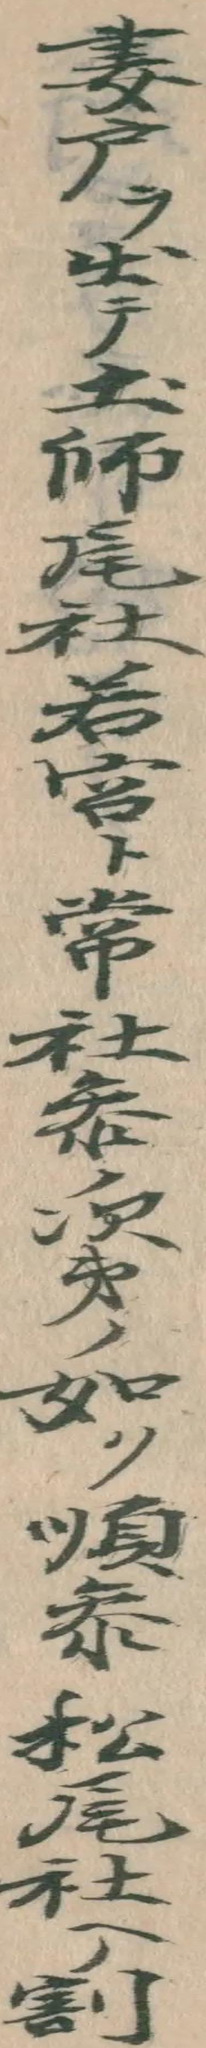妻戸ヲ出テ土師尾社若宮ト常社参ノ次第ノ如ク順参松尾社ヘノ割
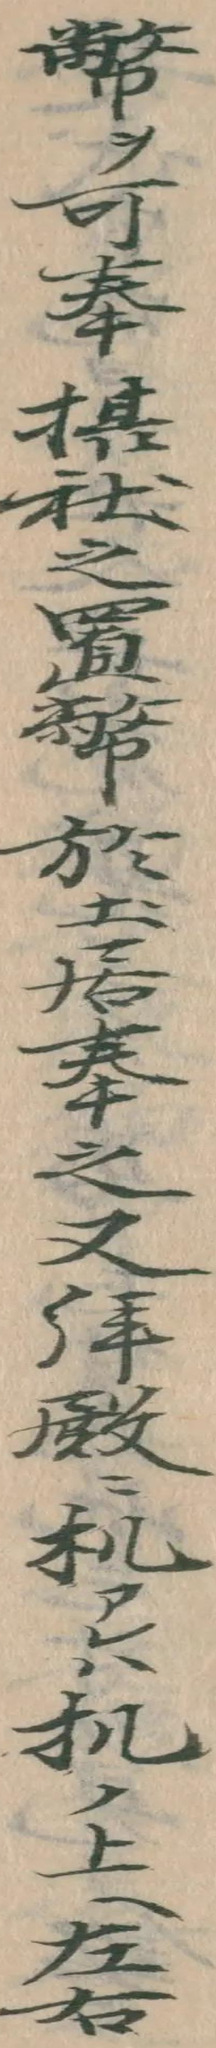幣ヲ可奉摂社之置幣於土居奉之又拝殿ニ机アレハ机ノ上へ左右
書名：賀茂社記録. 第11冊
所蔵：国立国会図書館 National Diet Library, JAPAN
